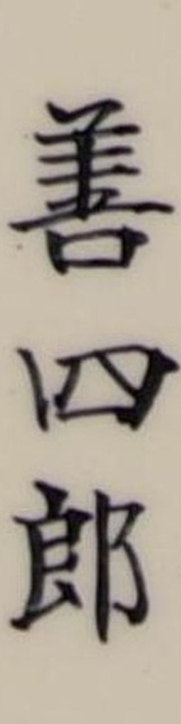善四郎
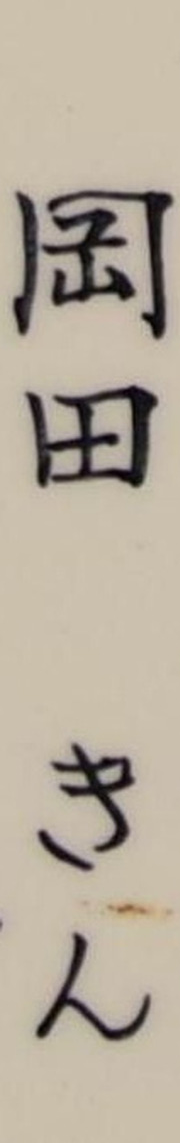岡田きん
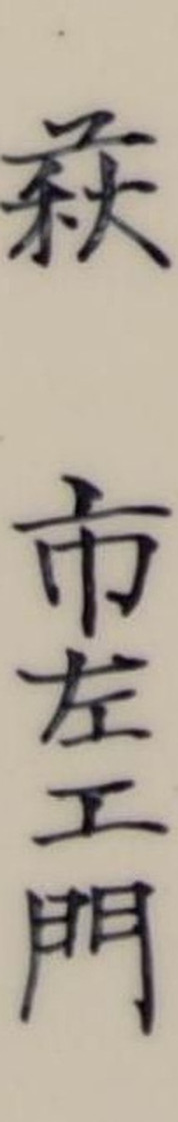萩市左エ門
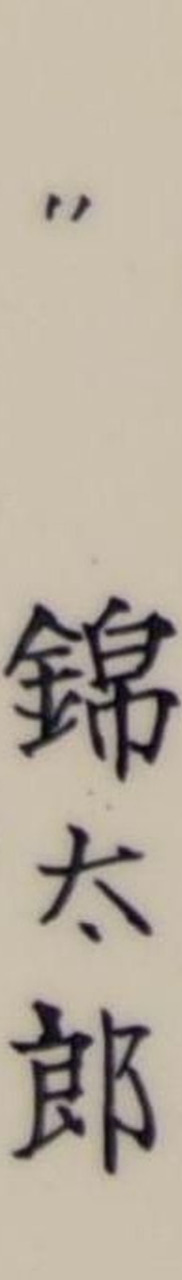錦太郎
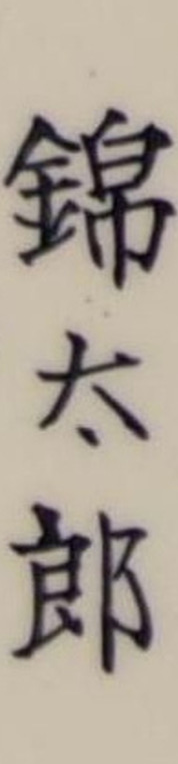錦太郎

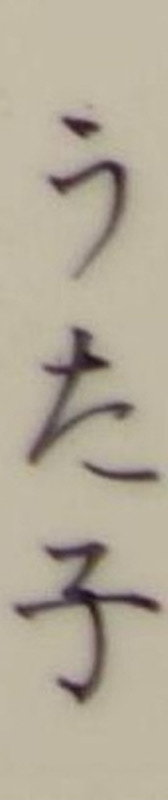うた子
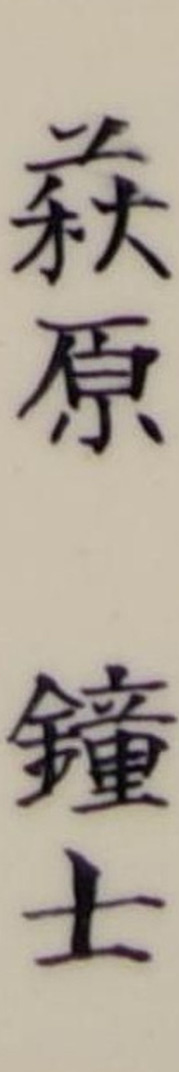萩原鐘士
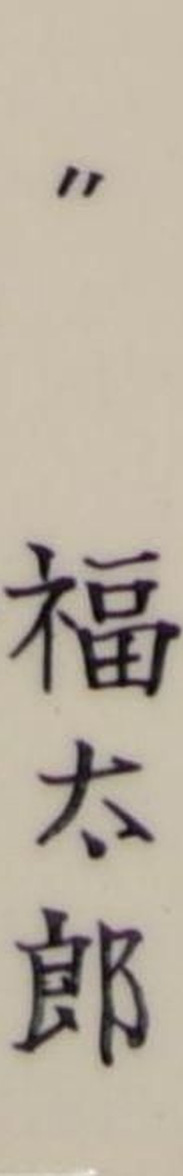福太郎
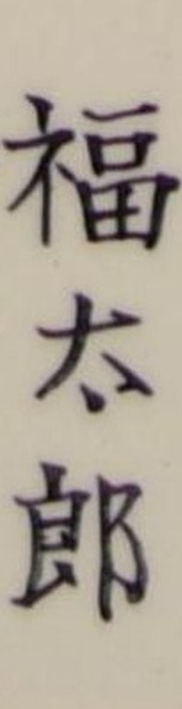福太郎
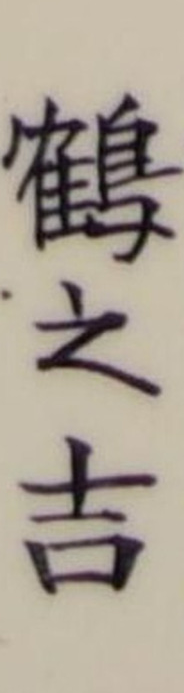鶴之吉
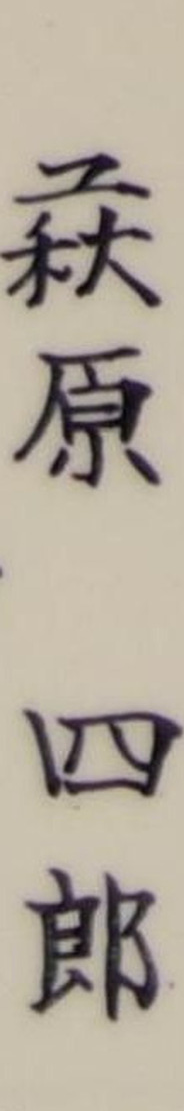萩原四郎
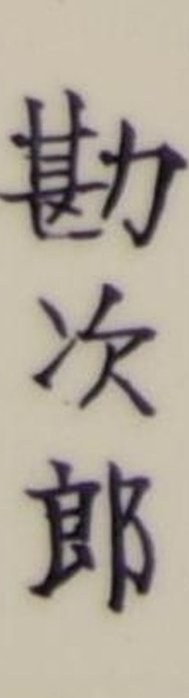勘次郎
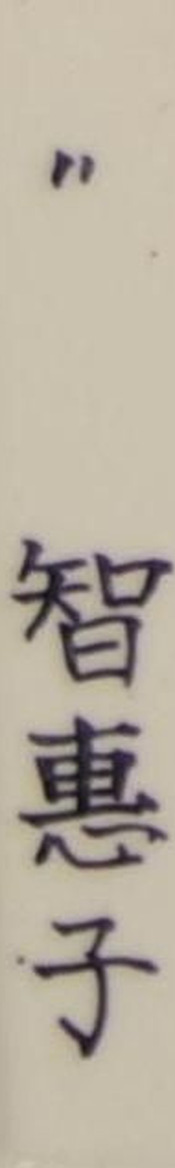智恵子
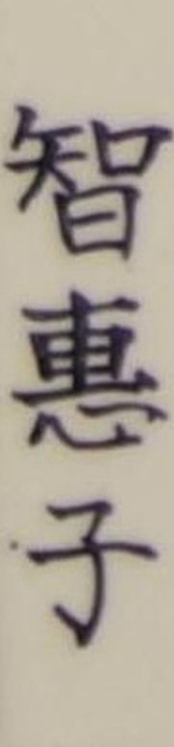智恵子

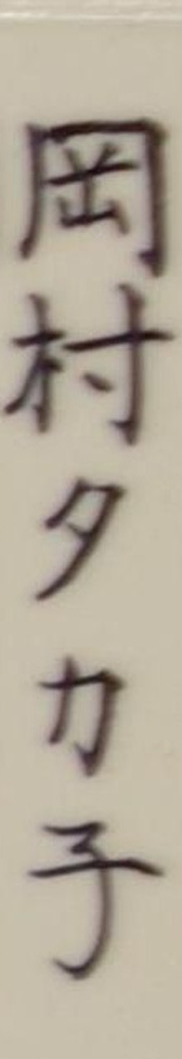岡村タカ子
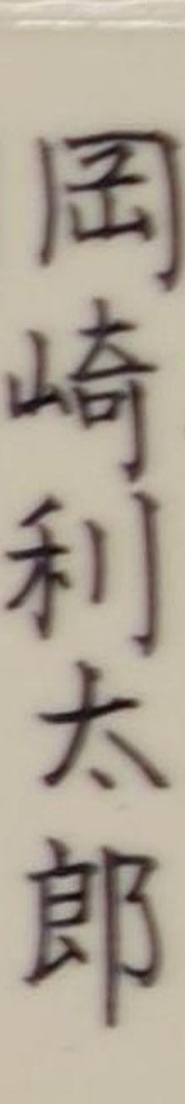岡崎利太郎
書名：E~L
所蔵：高野山金剛峯寺
